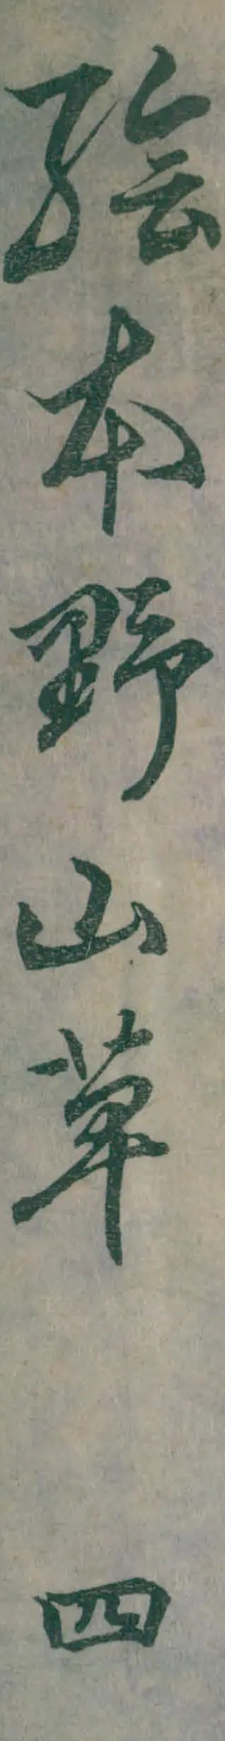絵本野山草四

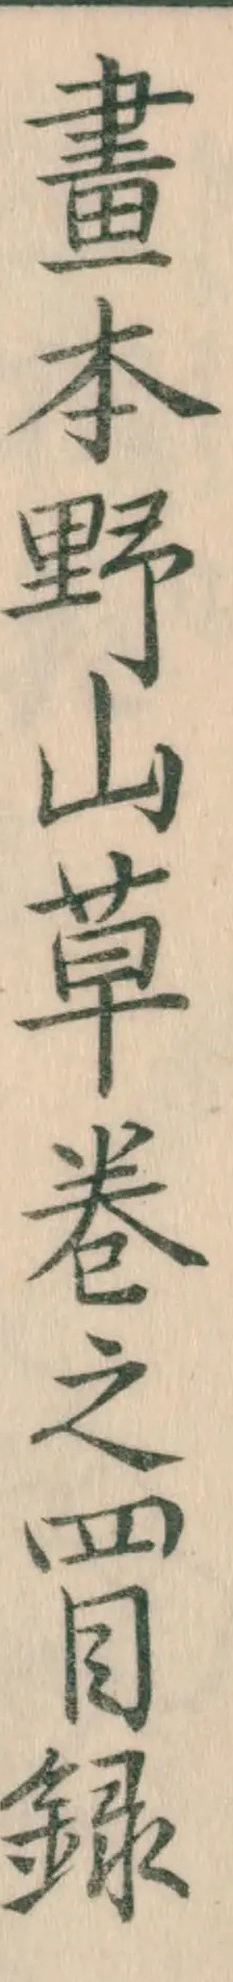画本野山草巻之四目録
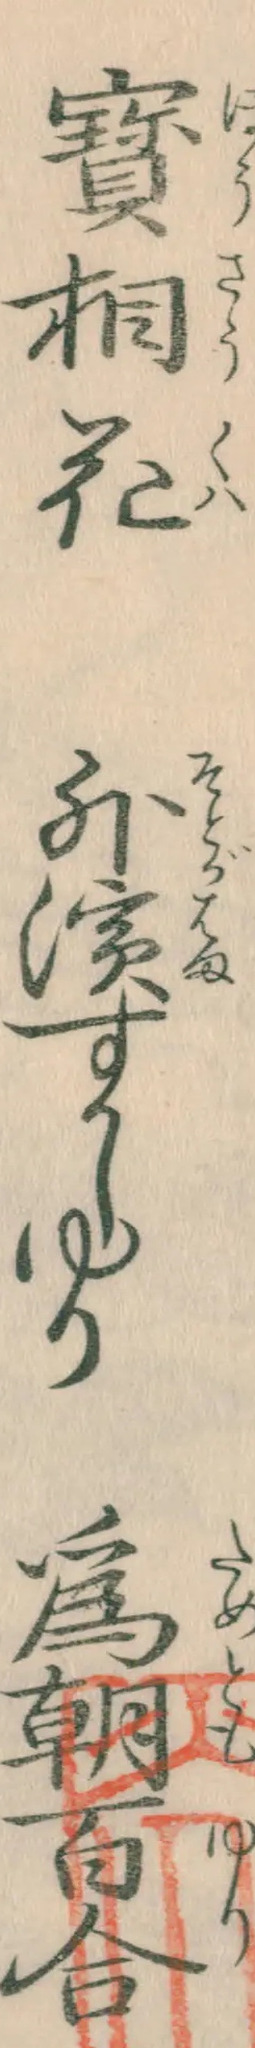宝相花外浜すかしゆり為朝百合
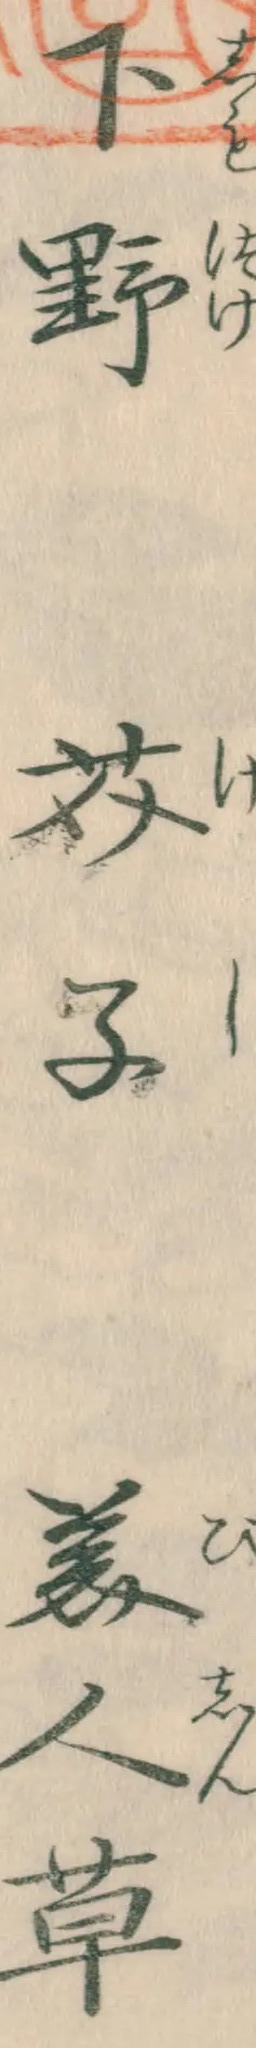下野芥子美人草
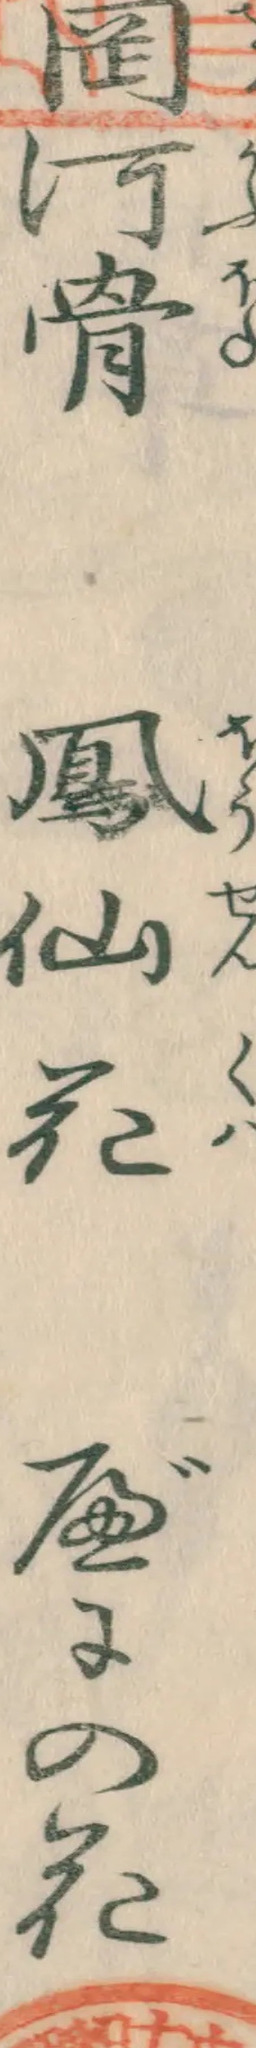岡河骨鳳仙花べにの花
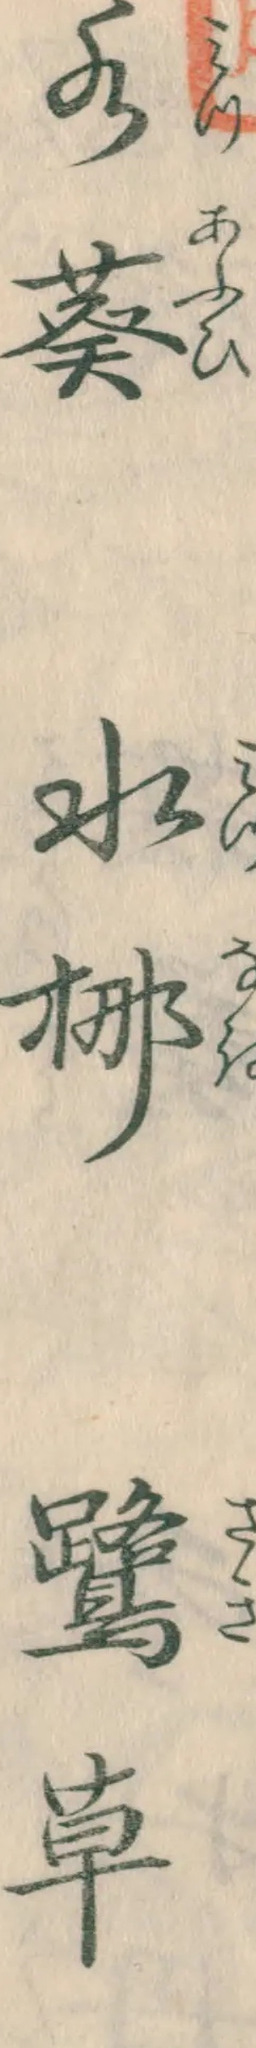水葵水梛鷺草

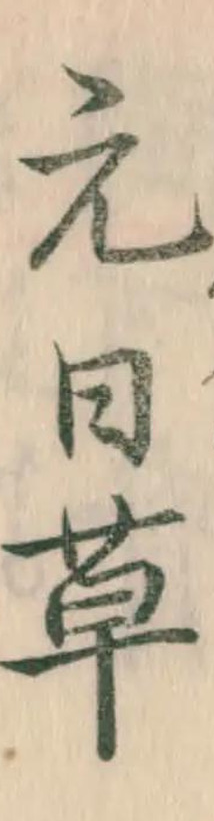元日草
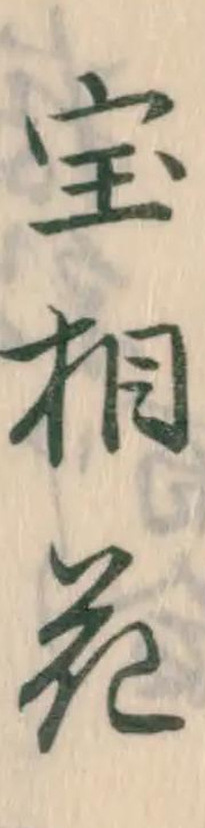宝相花

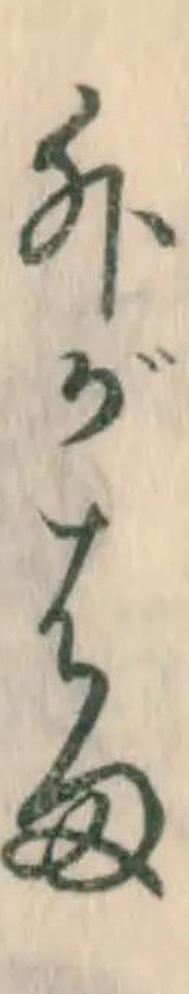外がはま
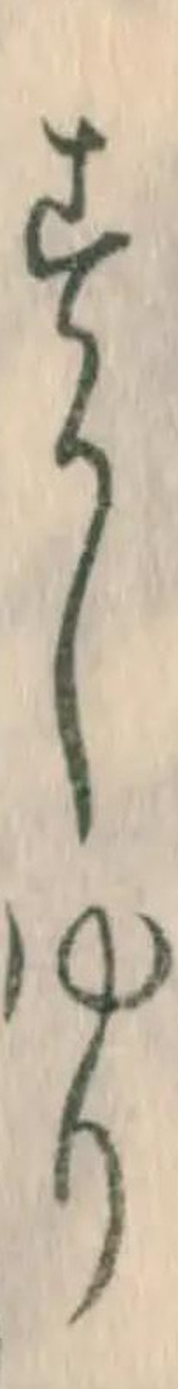すかしゆり
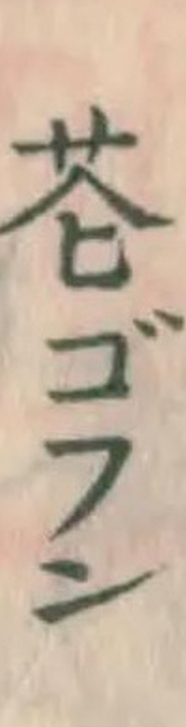花ゴフン
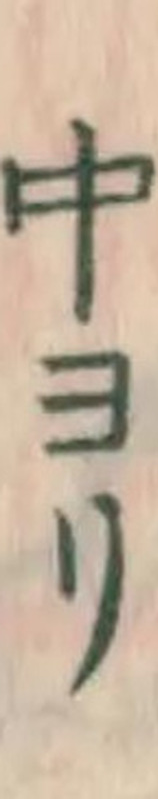中ヨリ
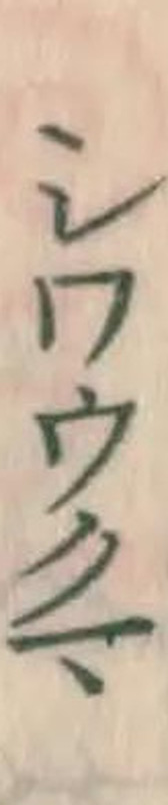シワウクマ

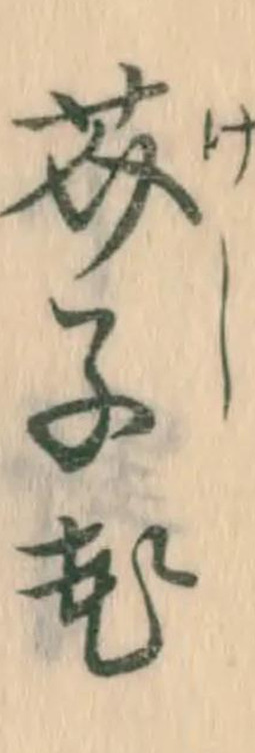芥子花
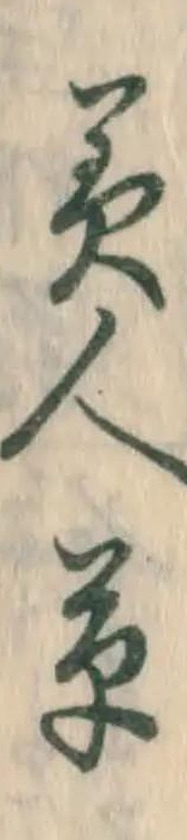美人草

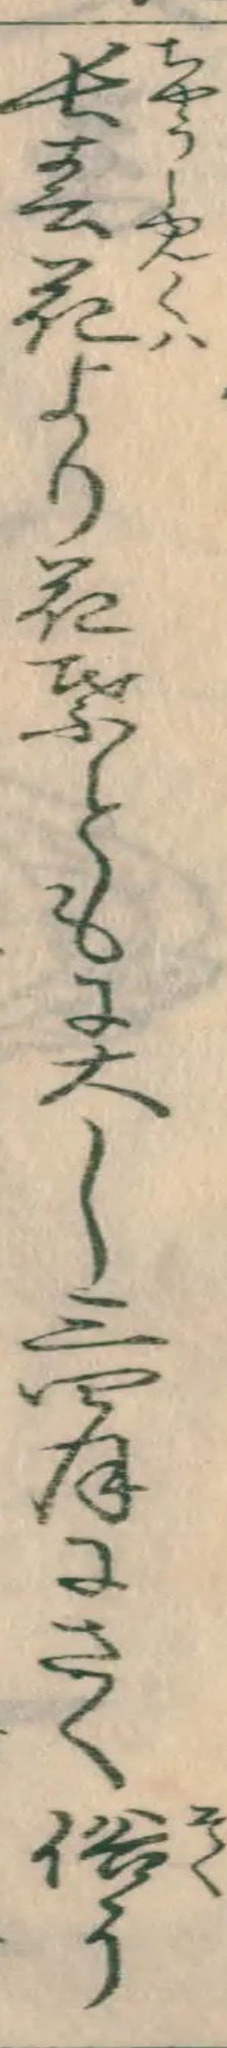長春花より花葉ともに大し三四月にさく俗に
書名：畫本野山草. [4]
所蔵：国立国会図書館 National Diet Library, JAPAN
